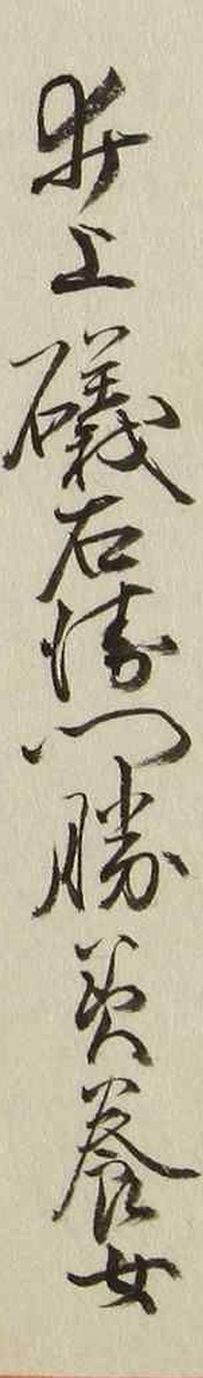井上礒右衛門勝美養女
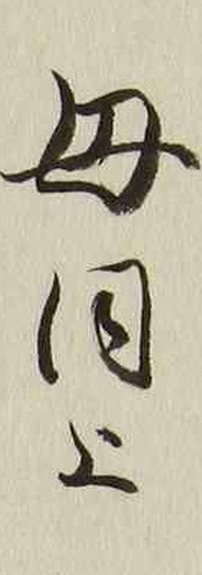母同上
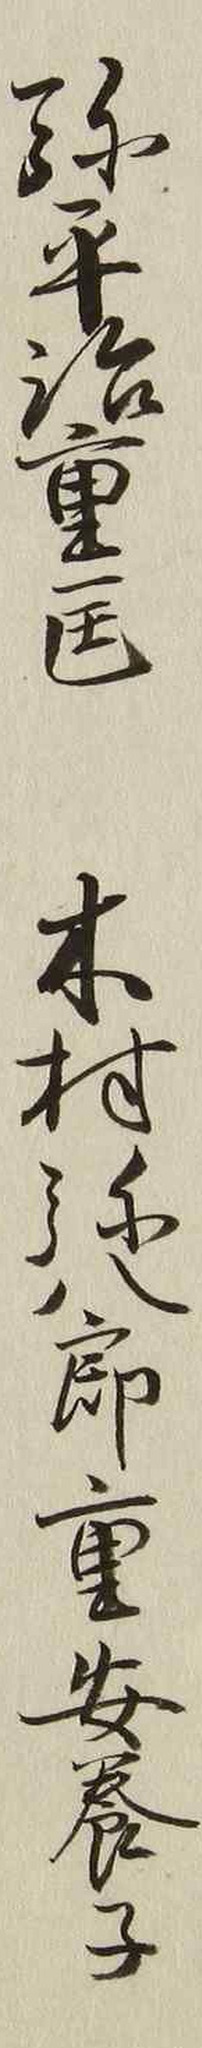孫平治重匡木村弥八郎重安養子
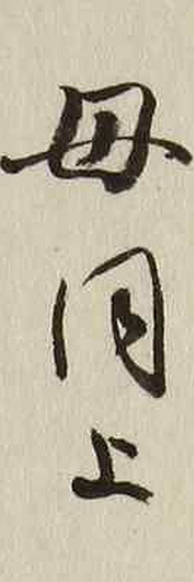母同上
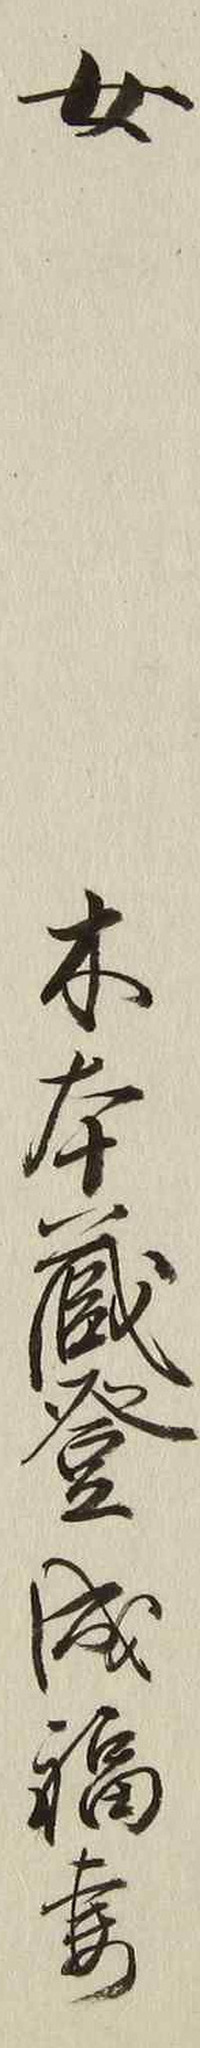女木本蔵登成福妻
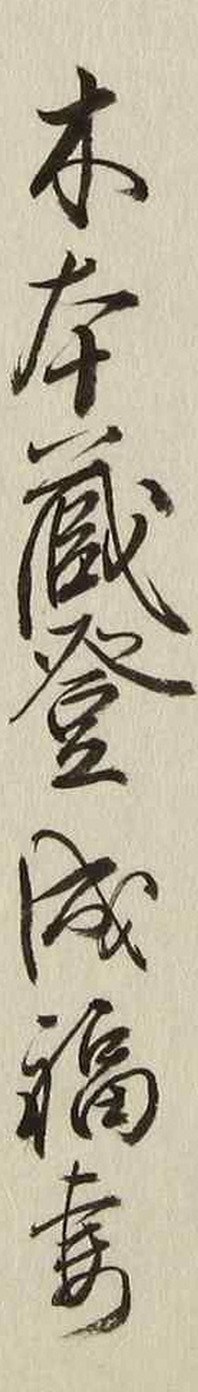女木本蔵登成福妻
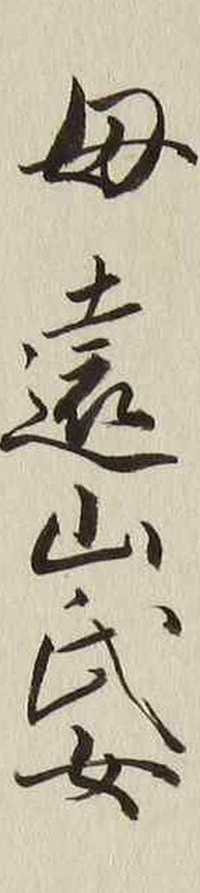母遠山氏女
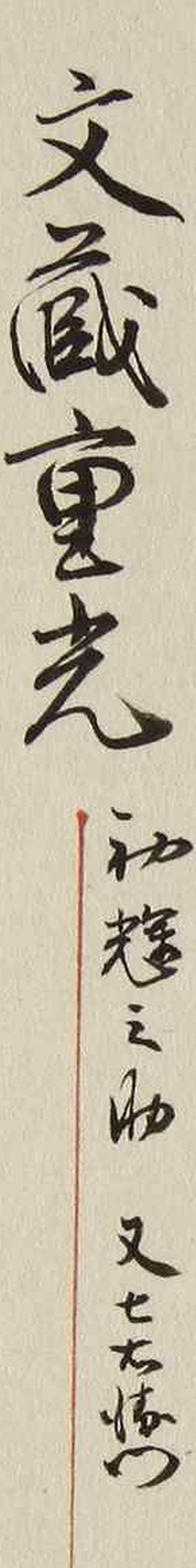文蔵重光初輝之助又七右衛門
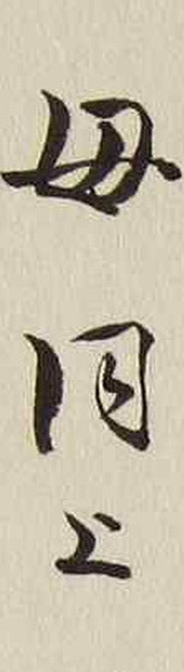母同上
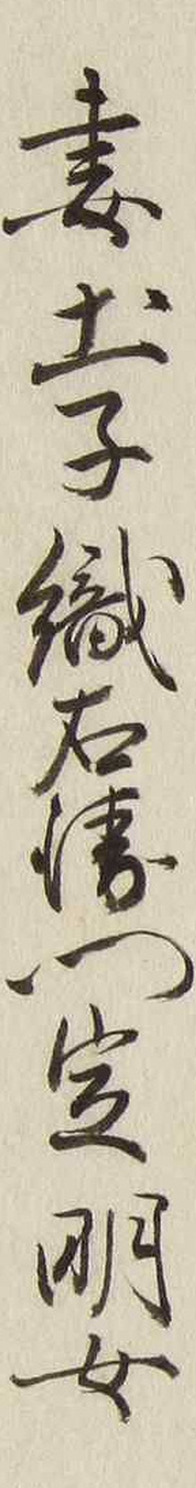妻土子織右衛門定明女

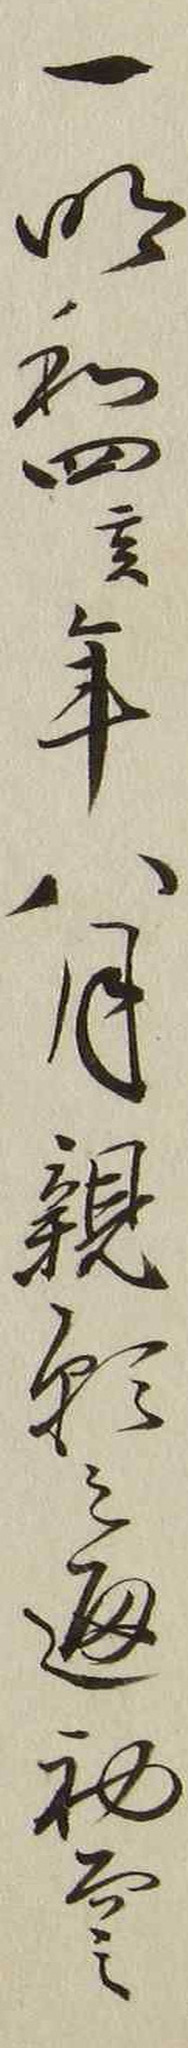一明和四亥年八月親願之通初而之
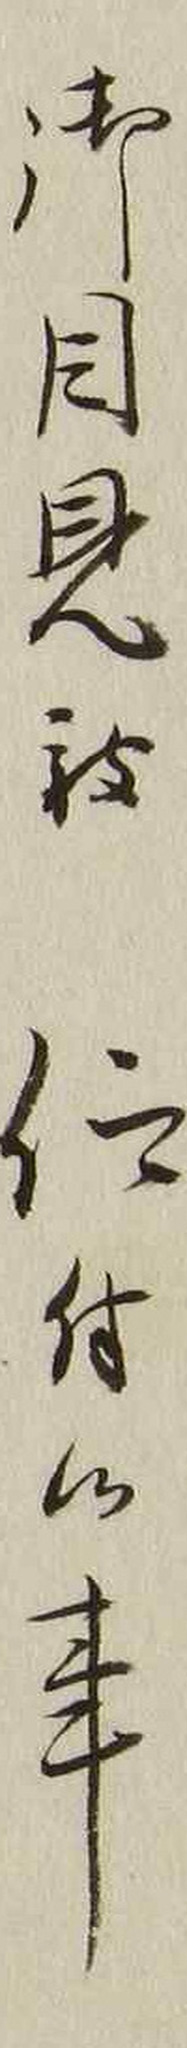御目見被仰付候事
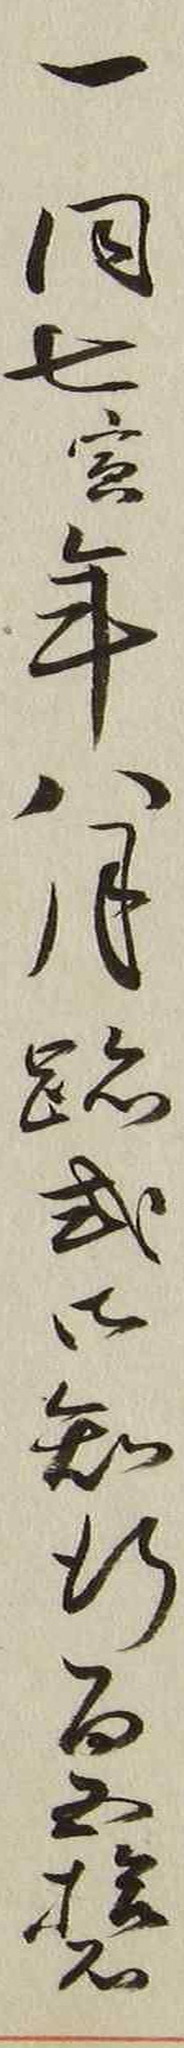一同七寅年八月跡式御知行百五拾石
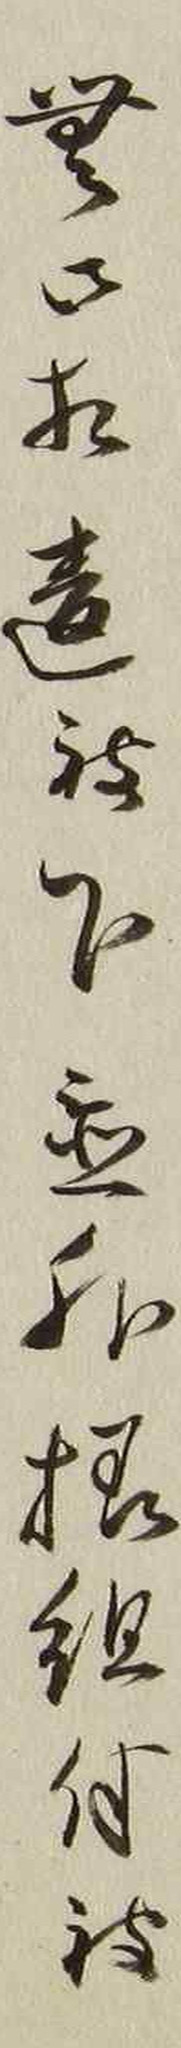無御相違被下置外様組付被
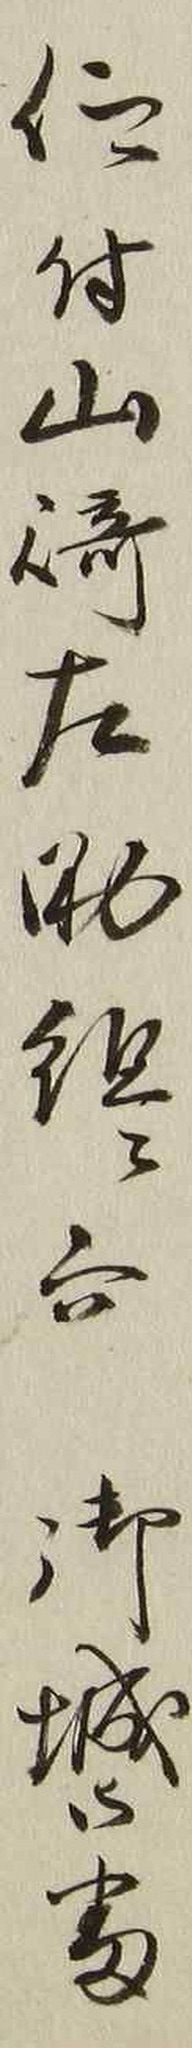仰付山崎左助組ニ而御城御番
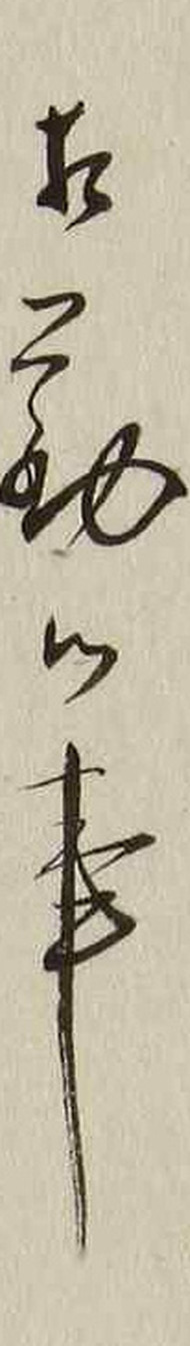相勤候事
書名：諸士系譜　巻之163　な之部5
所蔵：会津若松市立会津図書館
